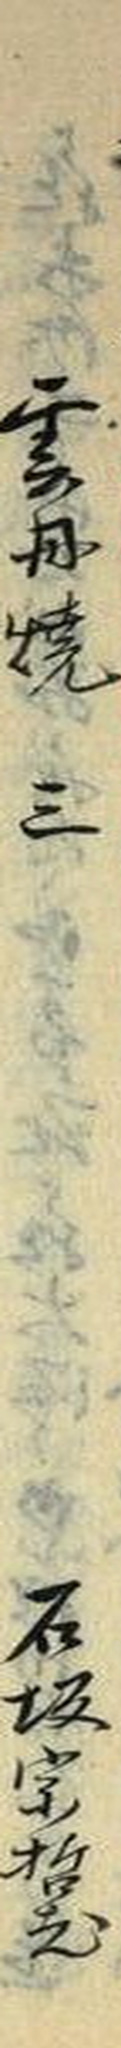雲丹焼三石坂宗哲老
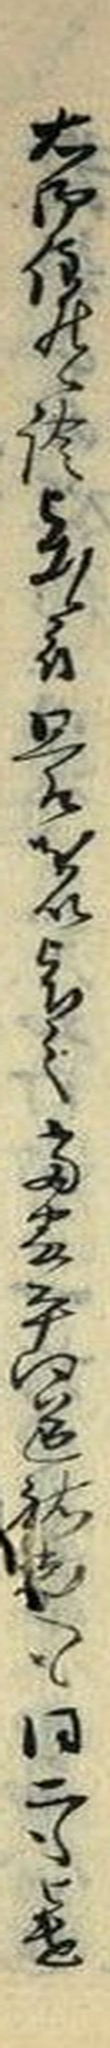右御住居へ儘被出候ニ付思召を以被下之当番平田道祐老へも同二ツ被遣
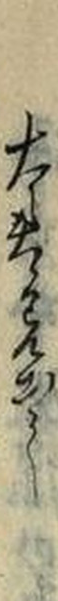大奥差へ出之
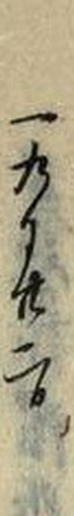一九月十六日
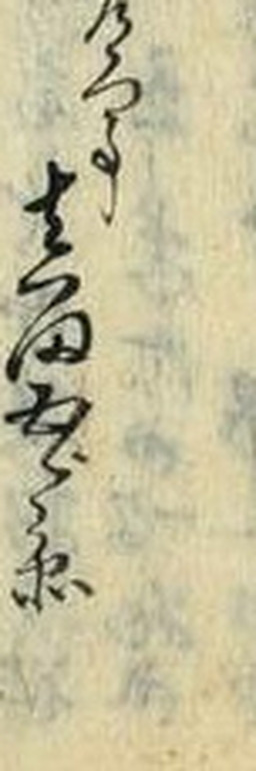真田五郎兵衛
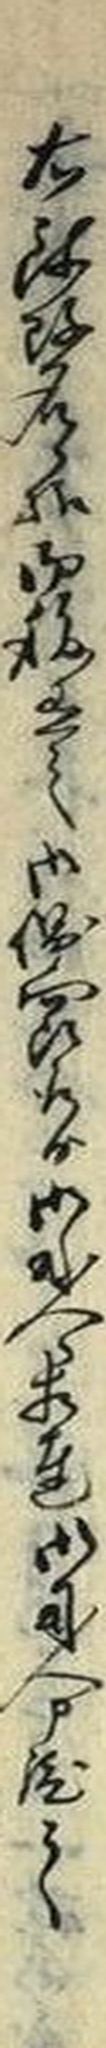右致改名候様御移有之御側向頭取御用人へ相達御用人申渡之
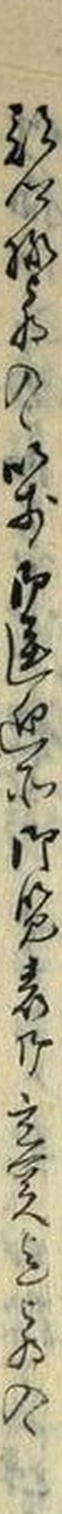部卿様被為入候以前御送迎所御覧表御玄関迄被為入候
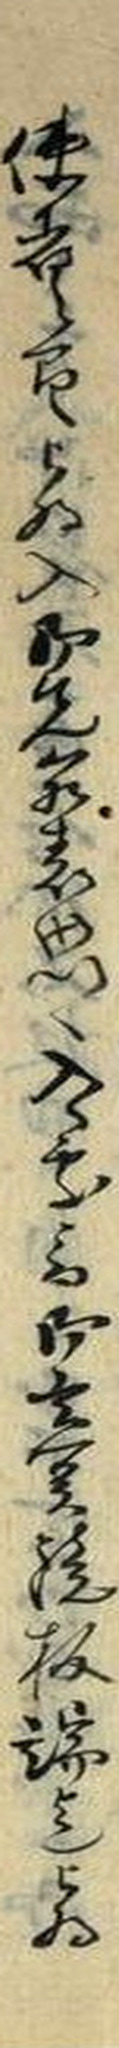使者之間へ被為入御先箱表御門へ入候処ニ而御玄関鏡板端迄被為

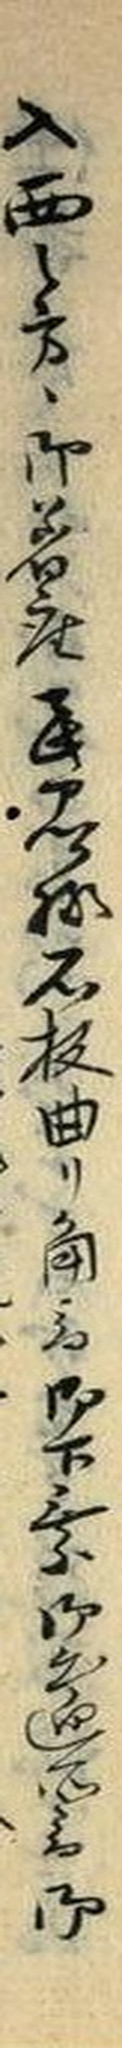入西之方へ御着座民部卿様石板曲り角ニ而御下乗御出迎所ニ而御
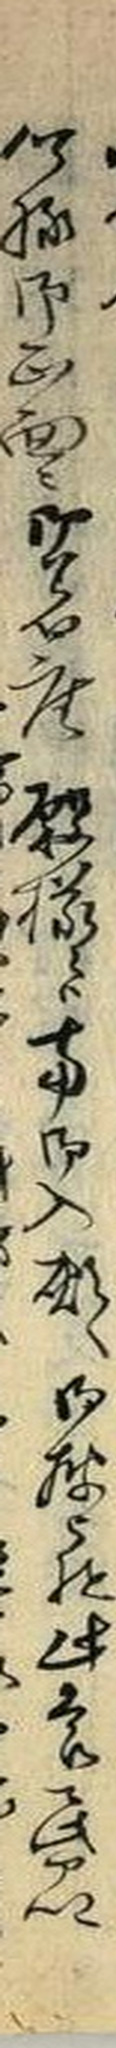卿様御正面ニ御着座殿様ニハ南御入頬へ御披被遊此節民部卿
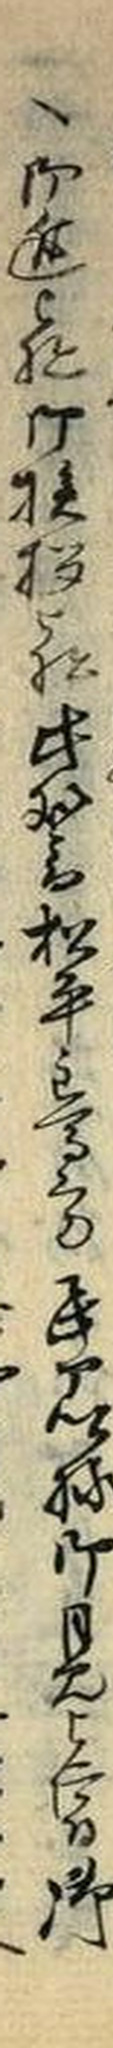へ御進被遊御挨拶被遊此処ニ而松平主馬方民部卿様御目見被仰付御
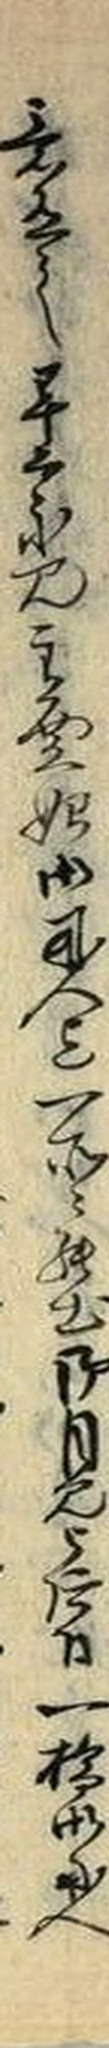意有之畢而永見主殿始御用人迄一所ニ罷出御目見被仰付一橋御用人
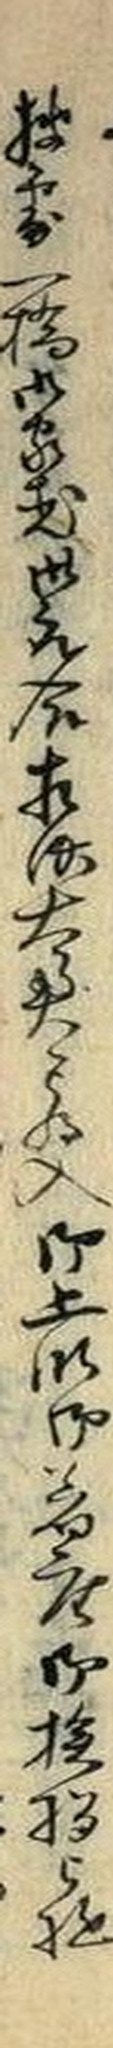披露一橋御家老御取合相済大奥被為入御上段御着座御挨拶被遊
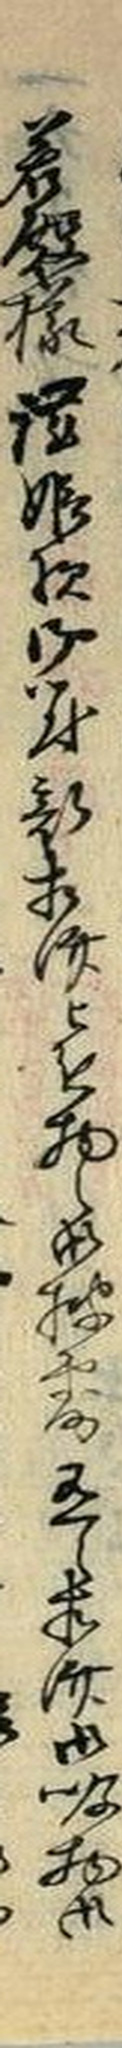若殿様謹姫様御対顔相済被進物之御披露有之相済御吸物御
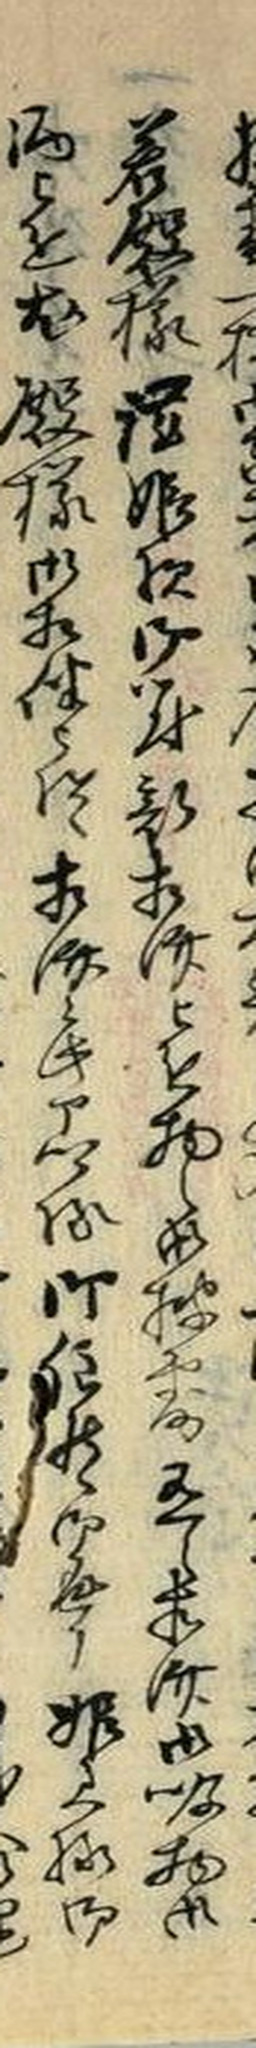酒被進尤殿様御相伴被遊候相済民部卿様御住居へ御通り姫君様御
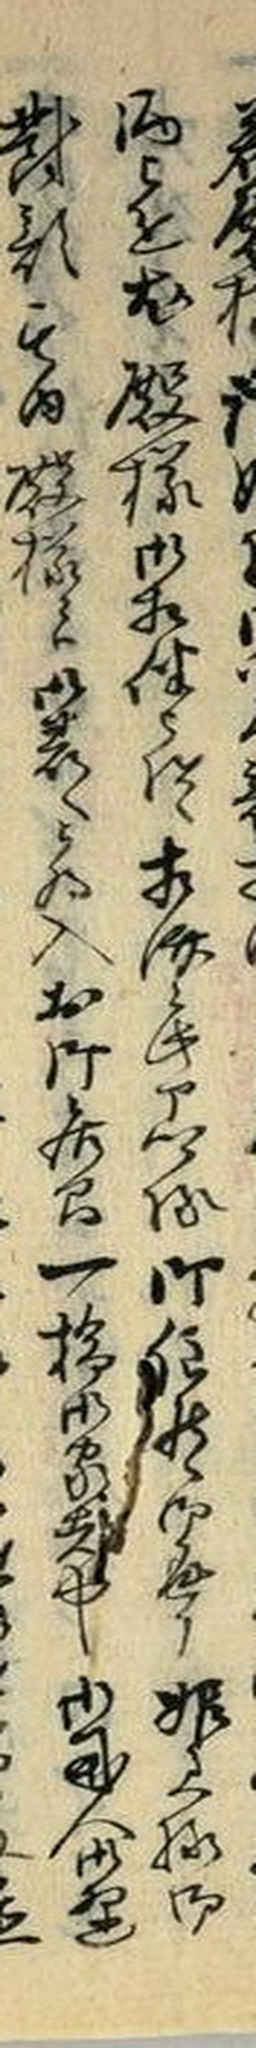対顔其内殿様ニハ御表へ被為入於御居間一橋御家老中御用人御逢
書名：少傅日録抄（斉承付側向頭取日記、在府）
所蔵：福井県文書館 Fukui Prefectural Archives
